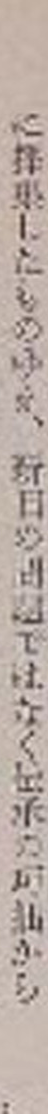に採集したものゆえ、新旧の問題ではなく伝承のから
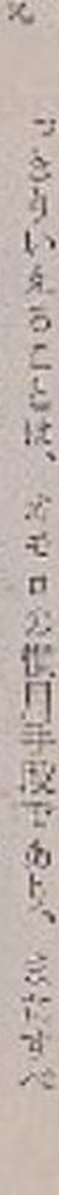っきりいえることは、オモロの慣用手段であり、またすべ
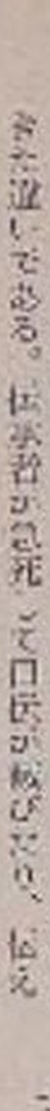きた違いである。伝承者が急死して口伝が滅びたり、伝え
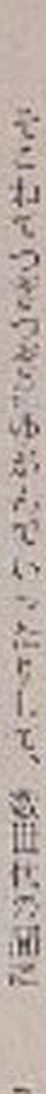そこねてつぎつぎにゆがんでいったりして、数世代の間に
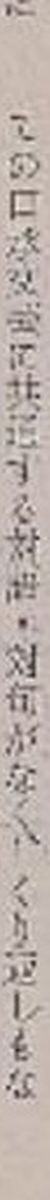ての口承文芸に共通する対語・対句がなく、くり返しもな
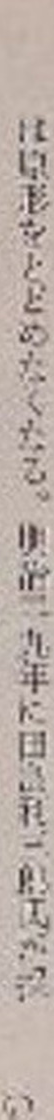は原形をとどめなくなる。明治二九年に田島利三郎氏が採
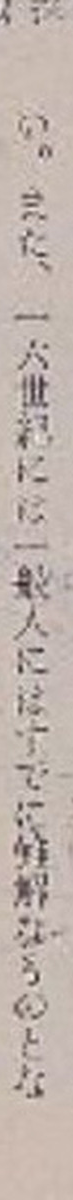い。また、一六世紀には一般人にはすでに難解なものとな
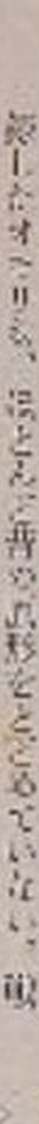したオモロも、ほとんど昔の原形をとどめていない、
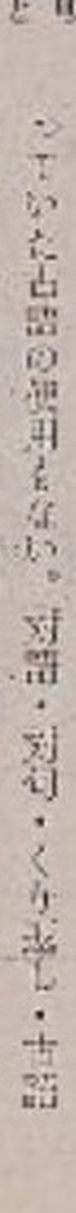っていた古語の使用もない。対語・対句・くり返し・古語
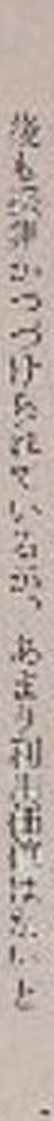後も採集がつづけられているが、あまり利用価値はないと
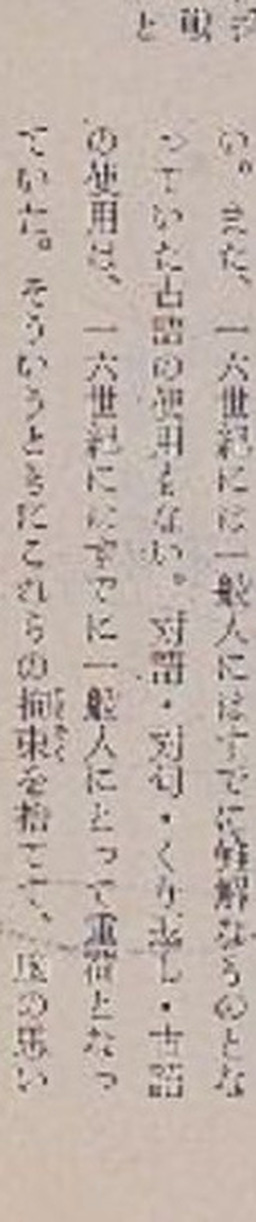の使用は、一六世紀にはすでに一般人にとって重荷となっ
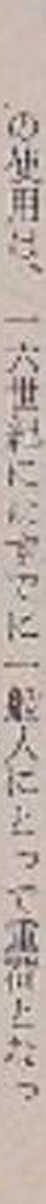の使用は、一六世紀にはすでに一般人にとって重荷となっ
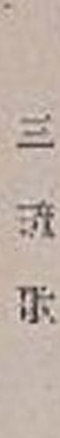三琉歌
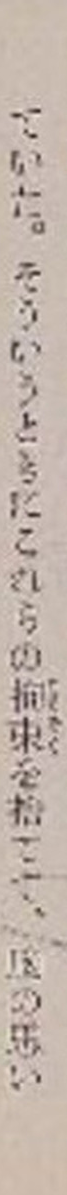ていた。そういうときにこれらの拘束を捨てて、民の思い
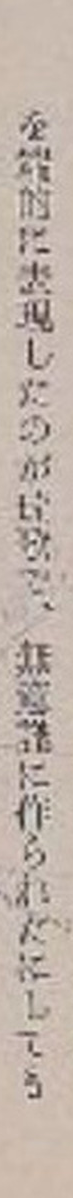を端的に表現したのが琉歌で、無意識に作られたにしても
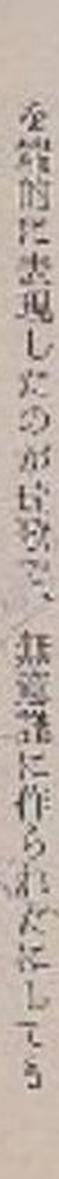を端的に表現したのが琉歌で、無意識に作られたにしても
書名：沖縄口承文芸
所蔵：University of the Ryukyus Library
